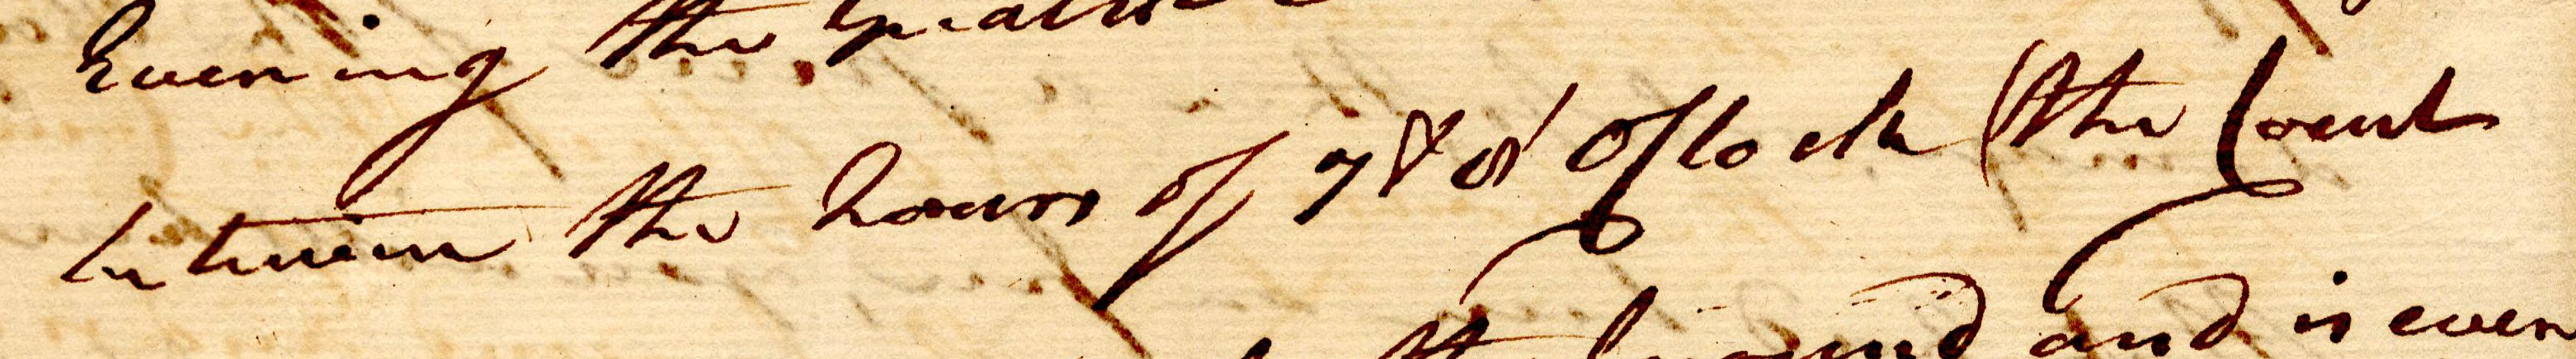between the hours of 7 & 8 o'Clock (the Court
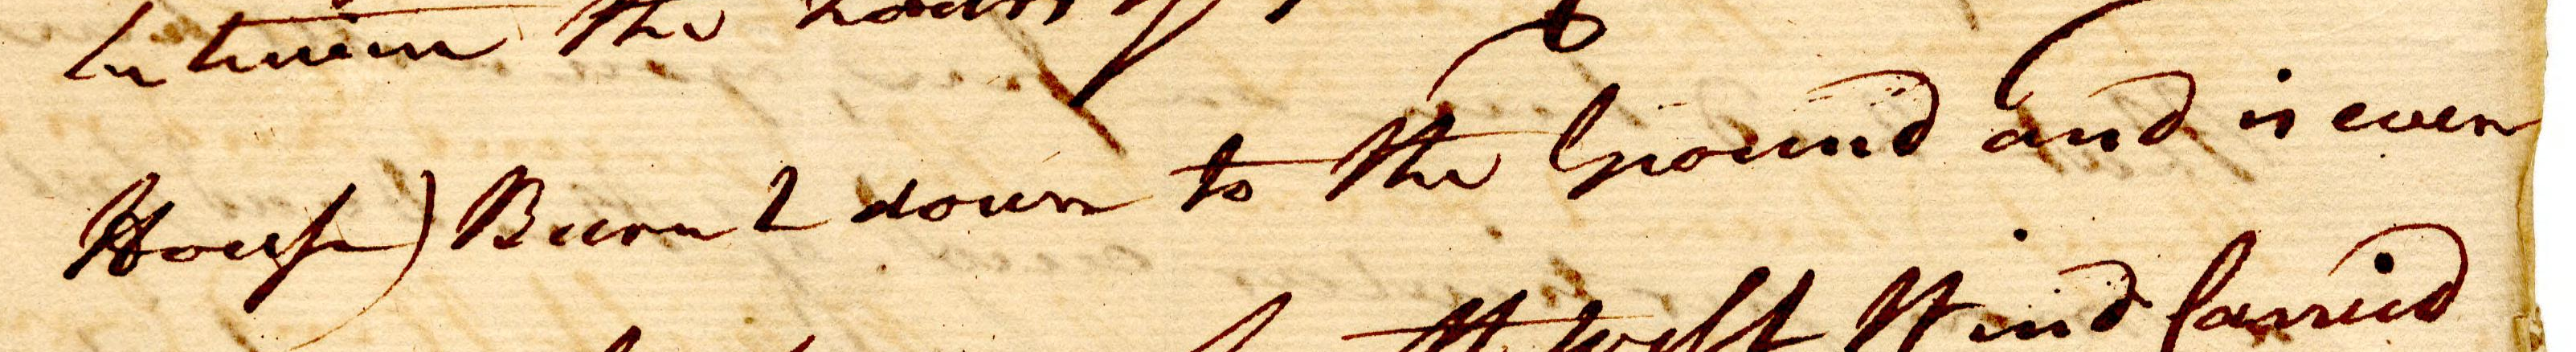House) Burned down to the Ground and is even
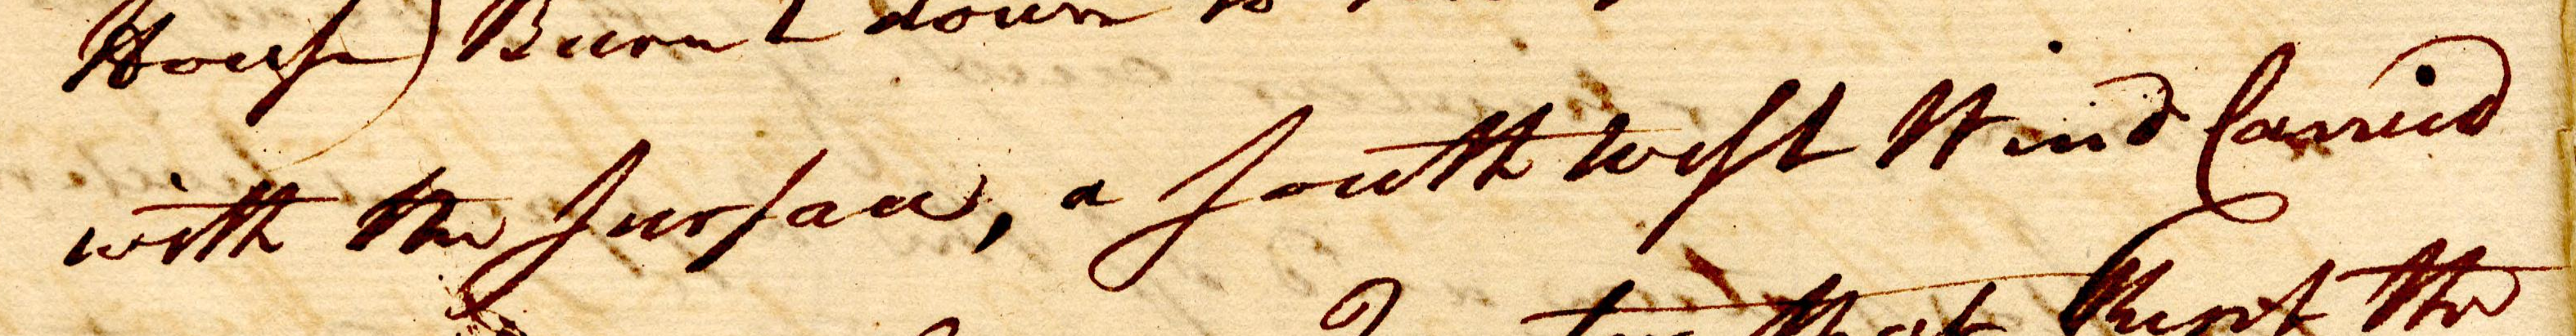with the surface, a south west Wind Carried
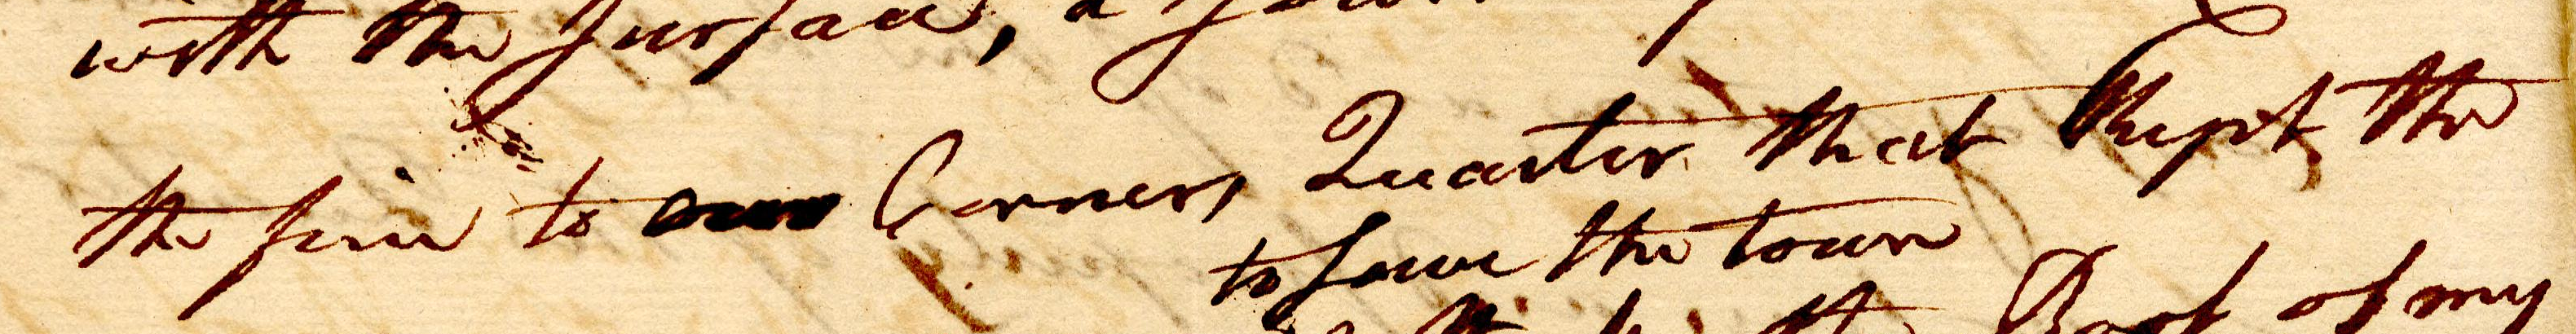the fire to [__] Corners Quarter that kept the
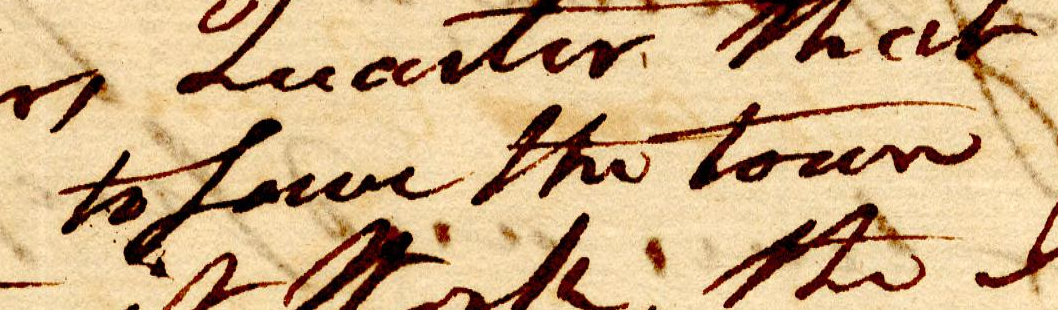to save the town
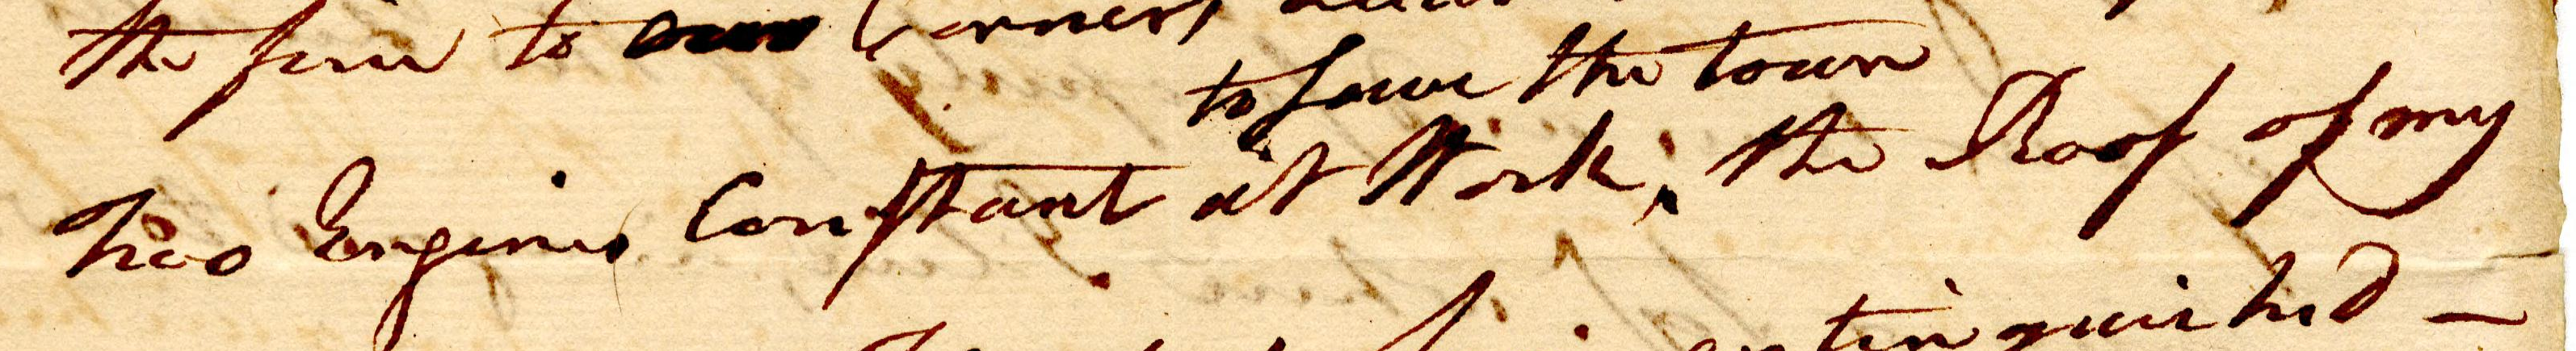Two Engines Constant at Work ^ the Roof of my
